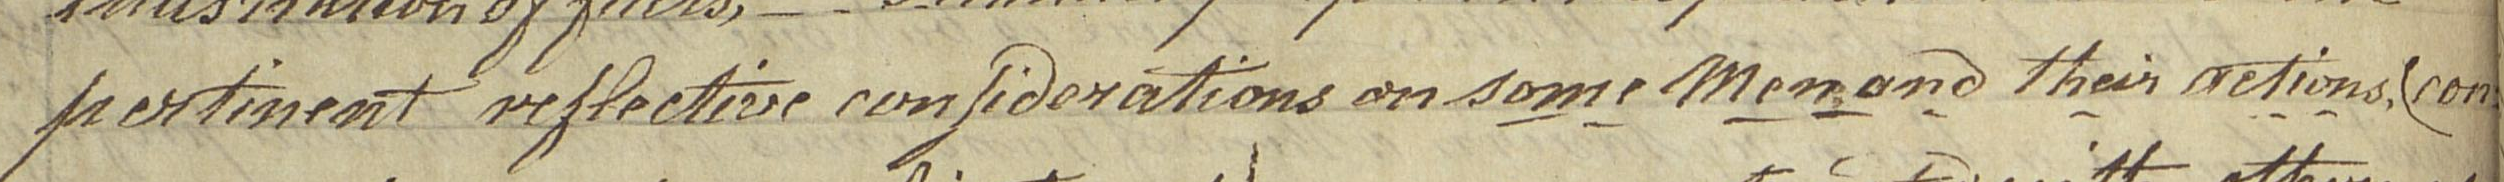pertinent reflective considerations on some men and their actions (con-
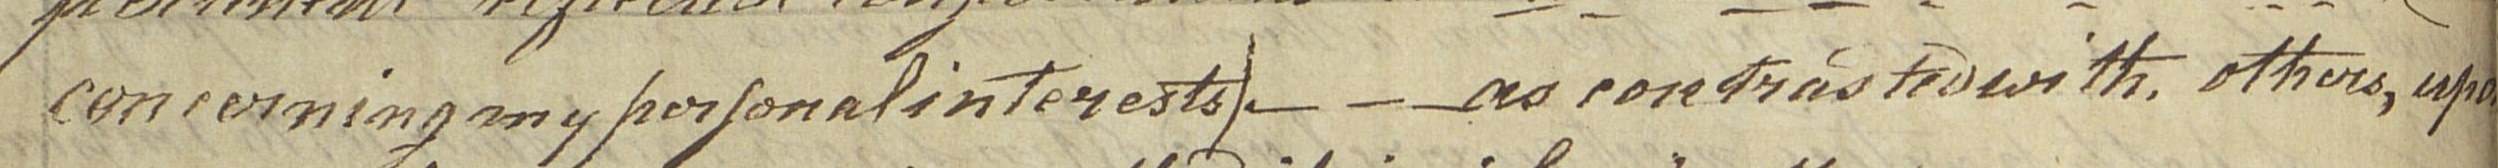concerning my personal interests) as contrasted with others, upon
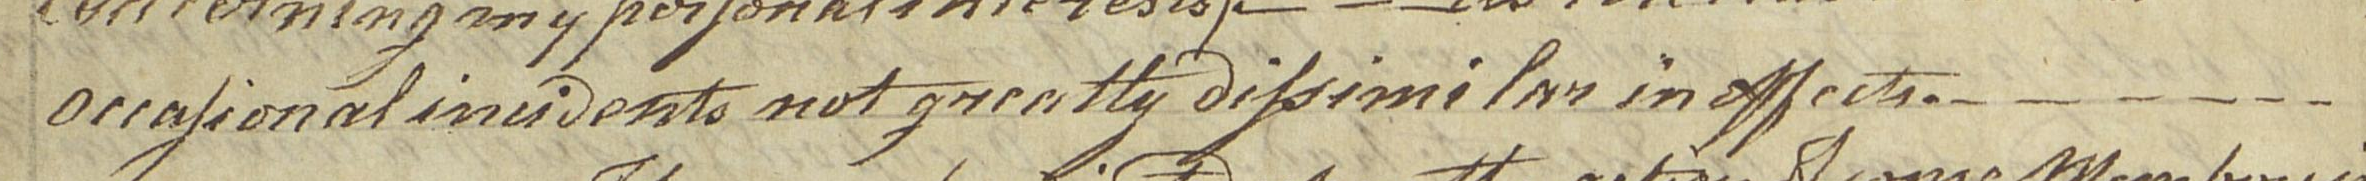occasional incidents not greatly dissimilar in effects.
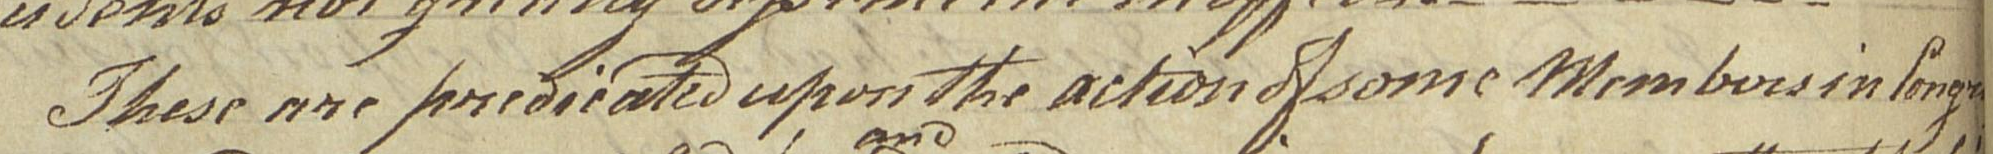These are predicated upon the action of some Members in Congress
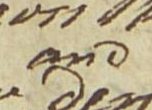and
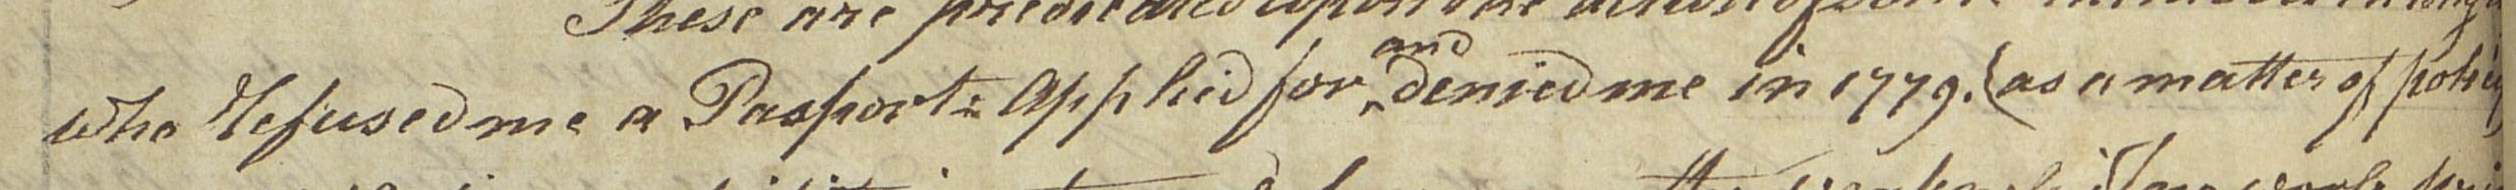who refused me a Pasport Applied for ^ denied me in 1779. (as a matter of pol-
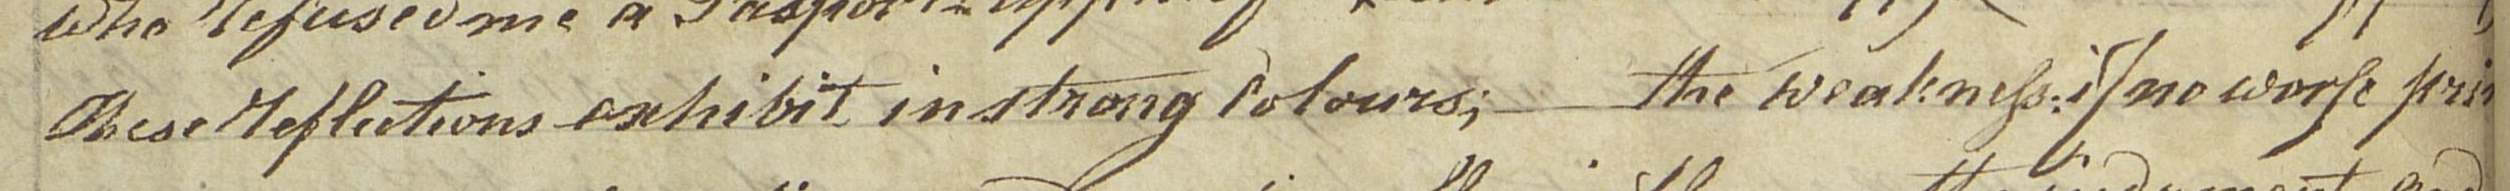These reflections exhibit in strong Colours; The weakness if no worse pri-
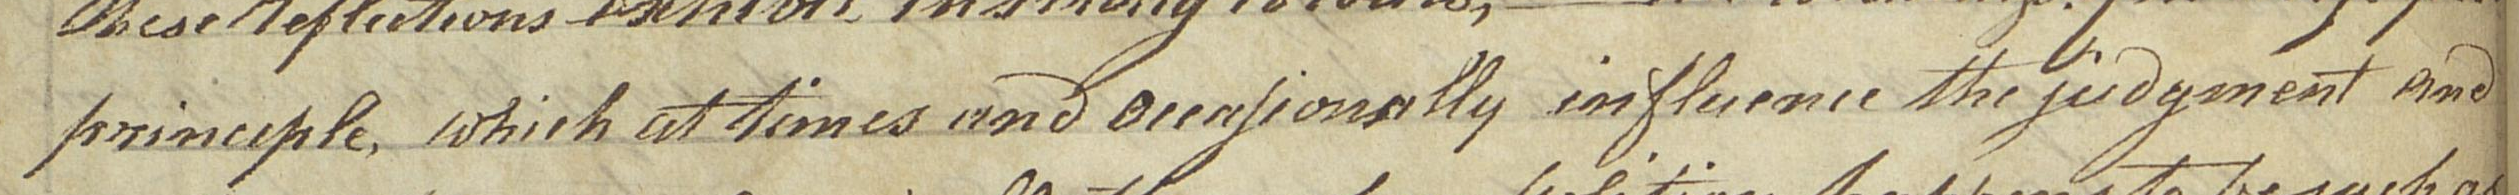principle, which at times and occasionally influence the judgment and
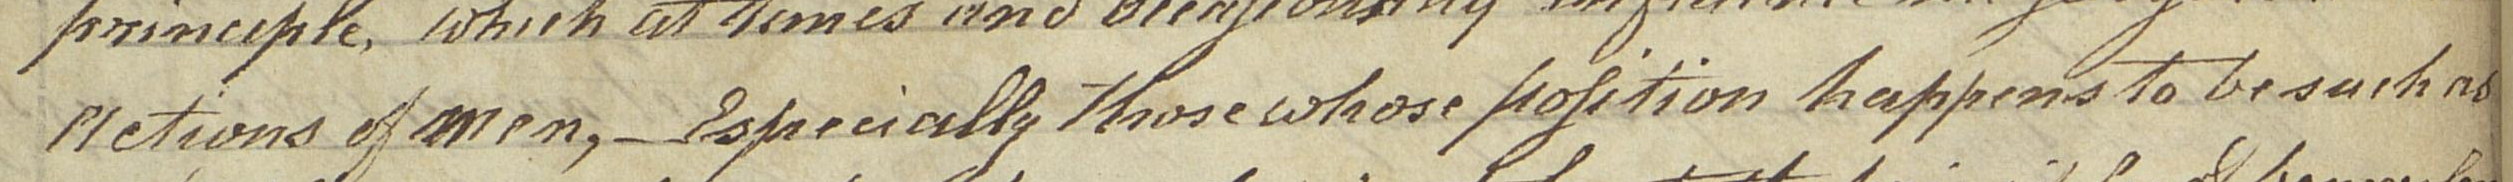Actions of men, Especially those whose position happens to be such as
